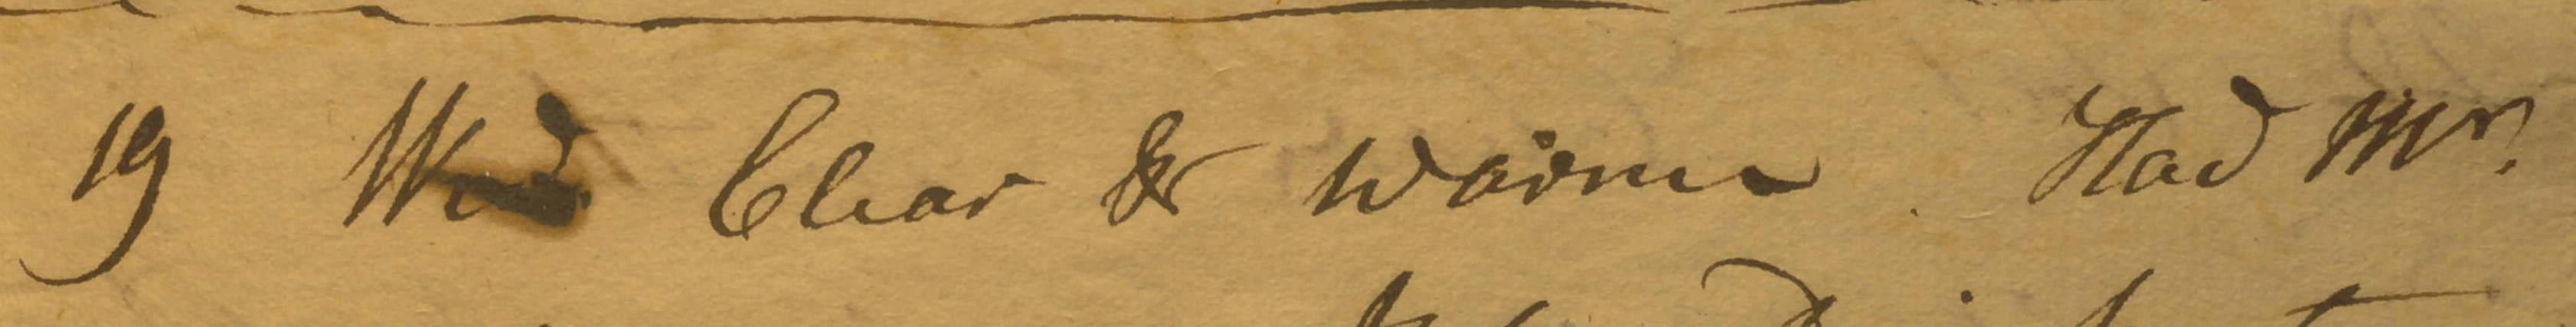19 Wed Clear & warme Had M^r.
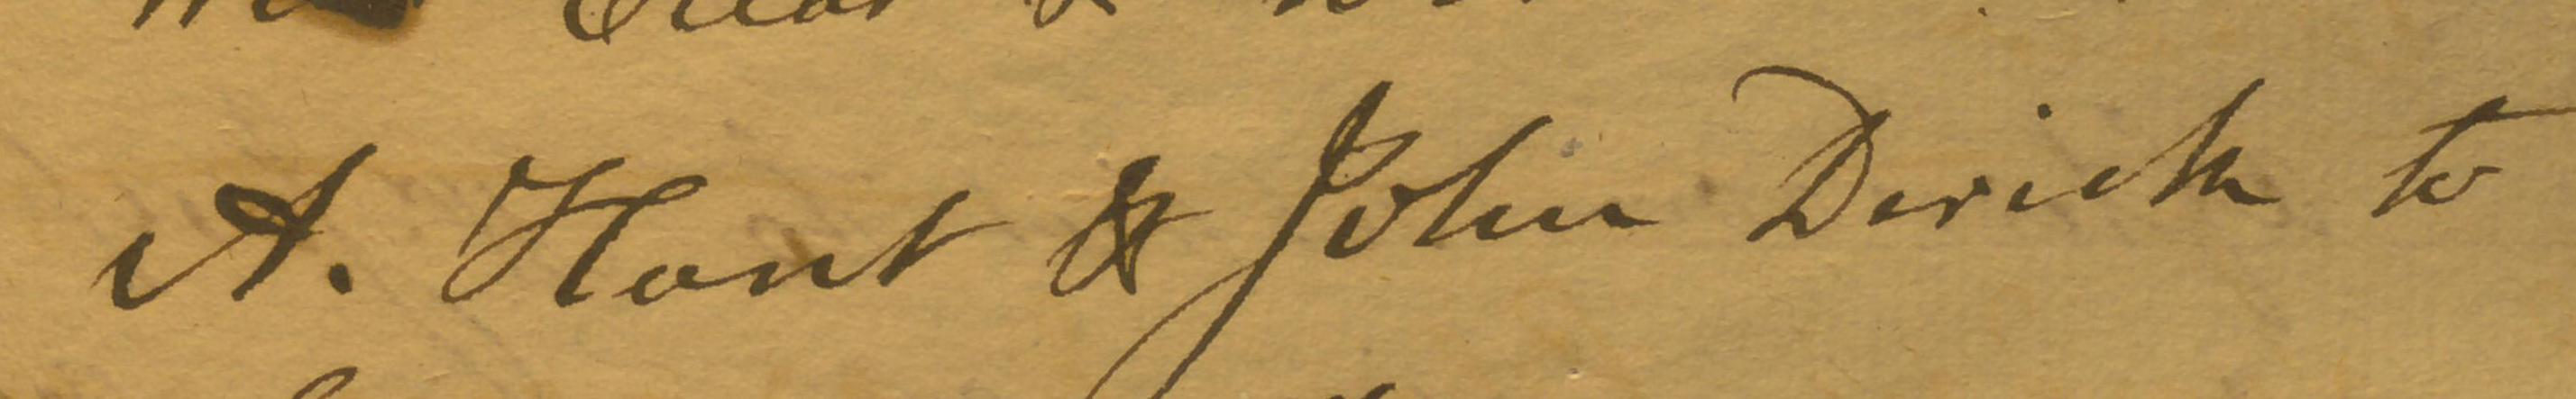A. Hunt & John Derick to
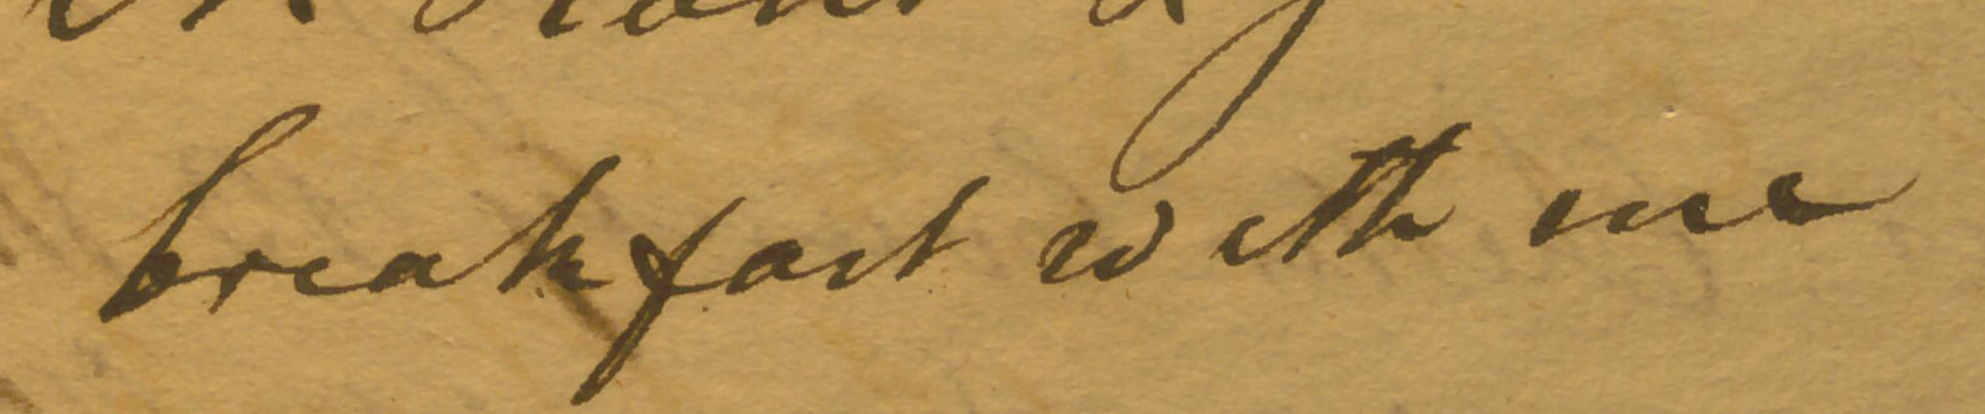breakfast with me
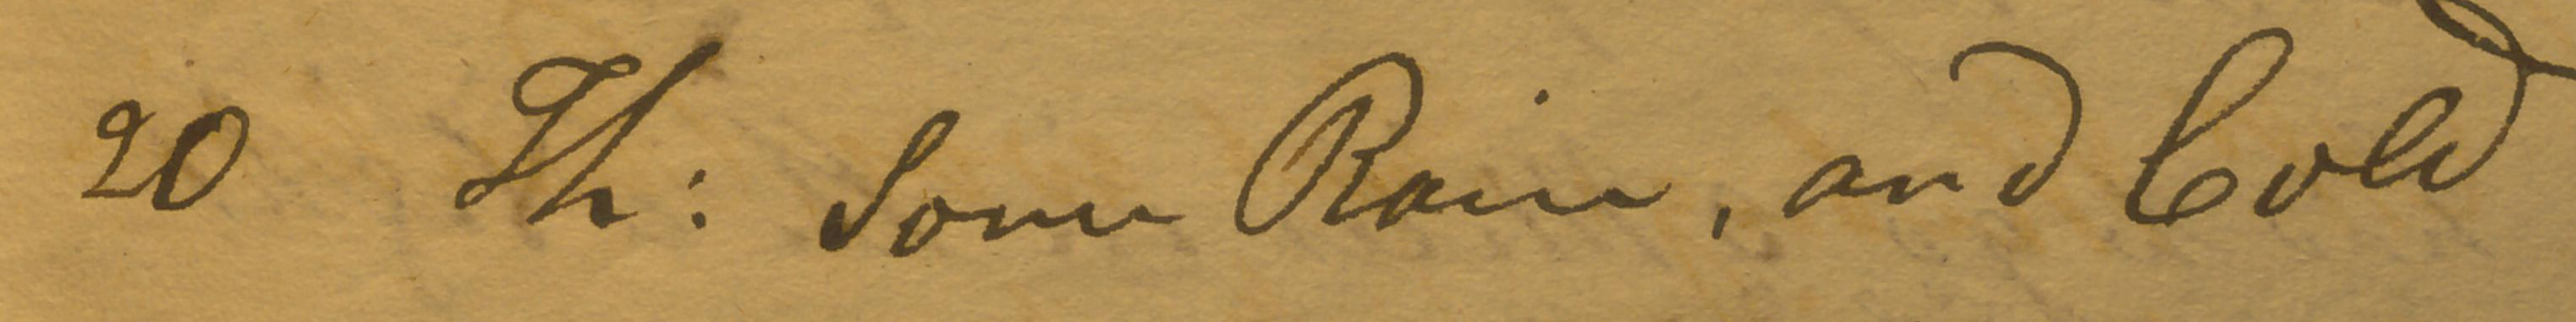20 Th: some Rain, and Cold
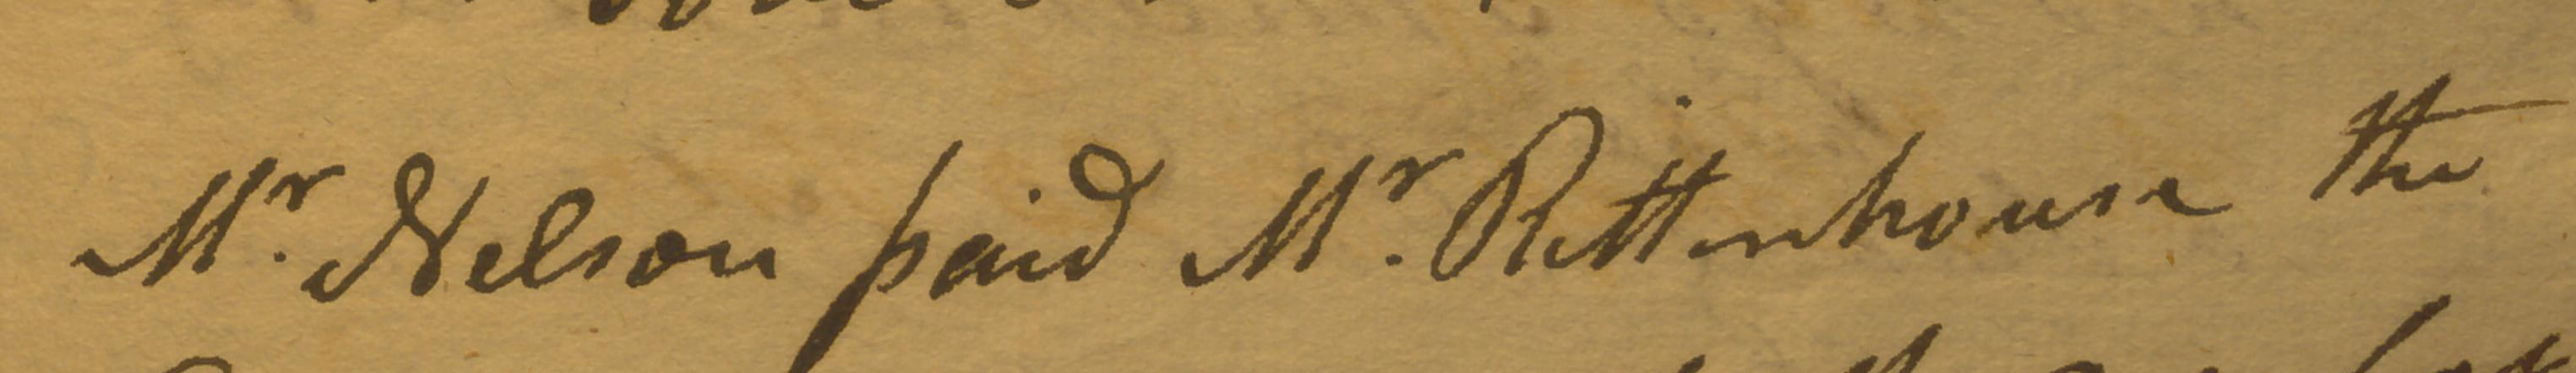M^r. Nelson paid M^r. Rittenhouse the
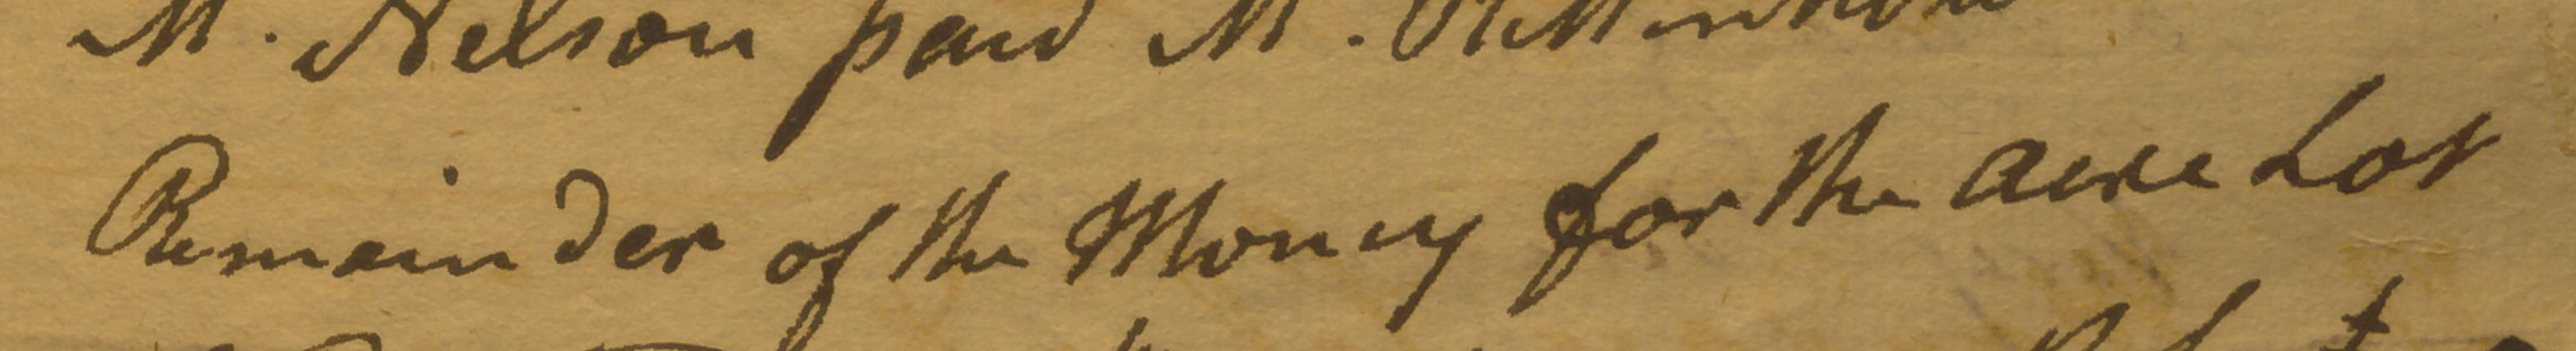Remainder of the Money for the acre Lot
